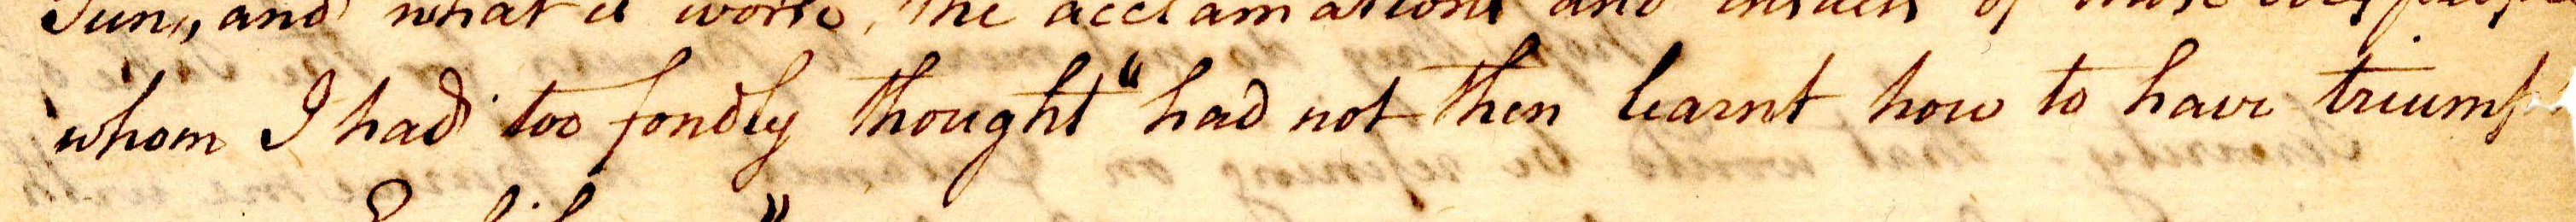whom I had too fondly thought had not then learnt how to have triumph
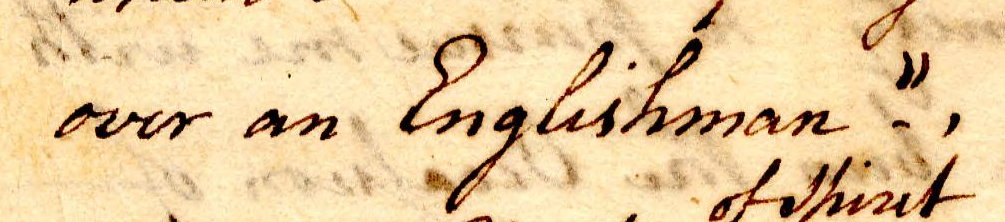over an Englishman."
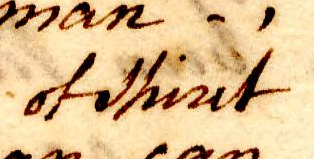of Spirit
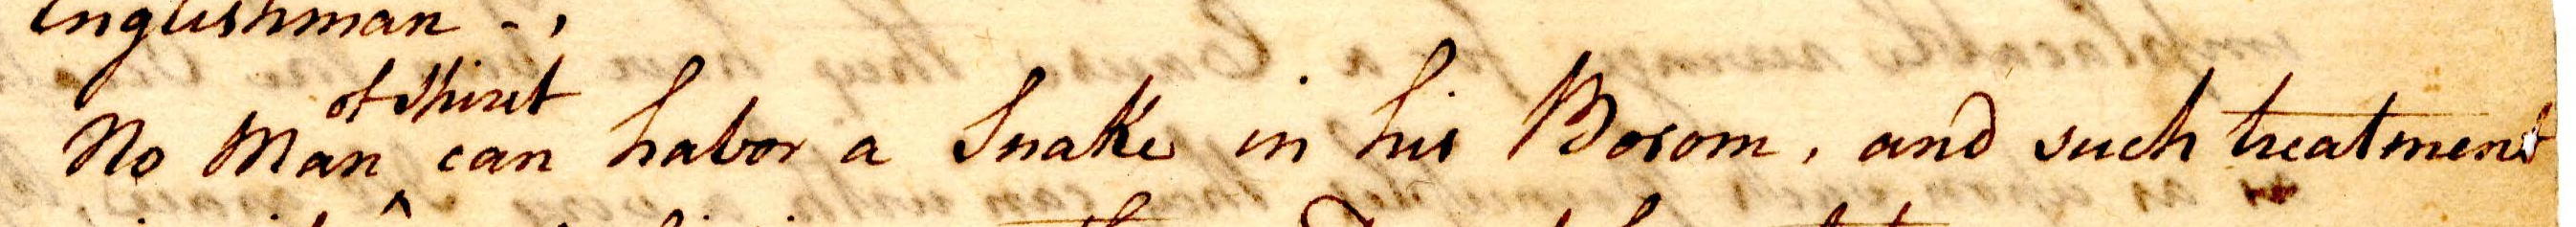No Man ^ can harbor a Snake in his Bosom, and such treatment
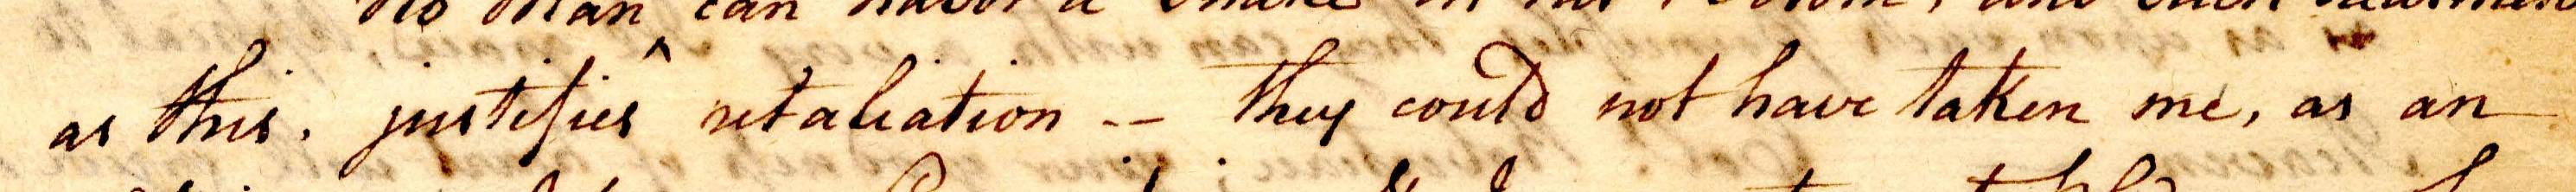as this justifies retaliation. They could not have taken me, as an
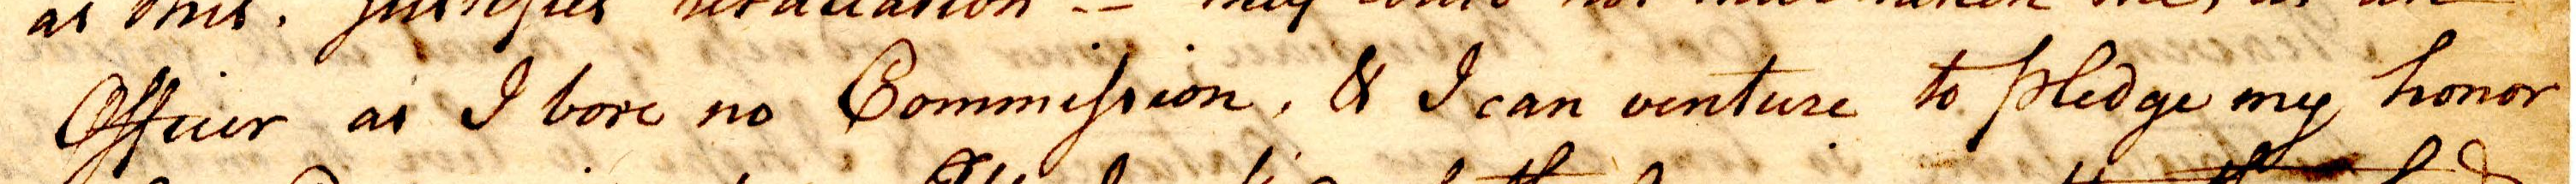Officer as I bore no Commission, & I can venture to pledge my honor
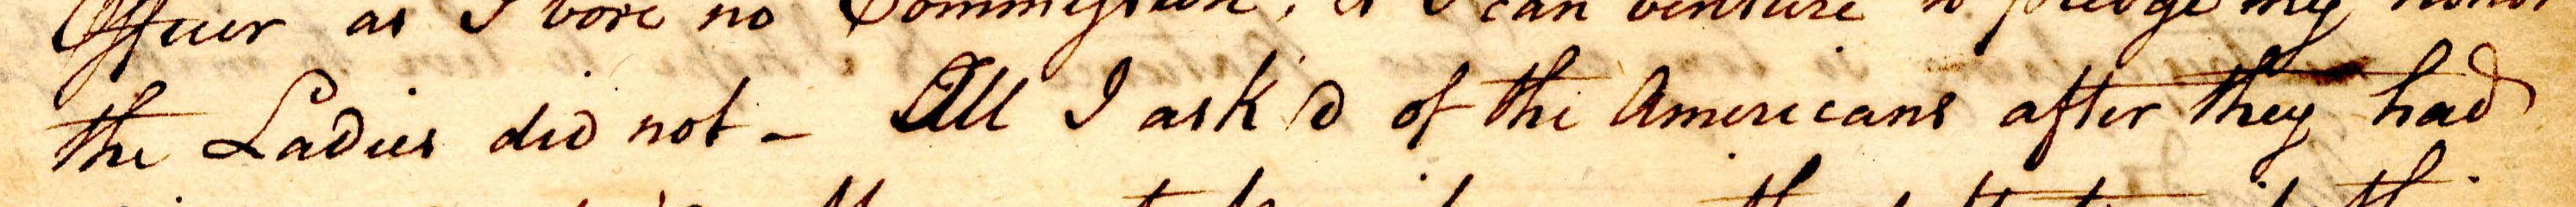the Ladies did not. All I ask'd of the Americans after they had
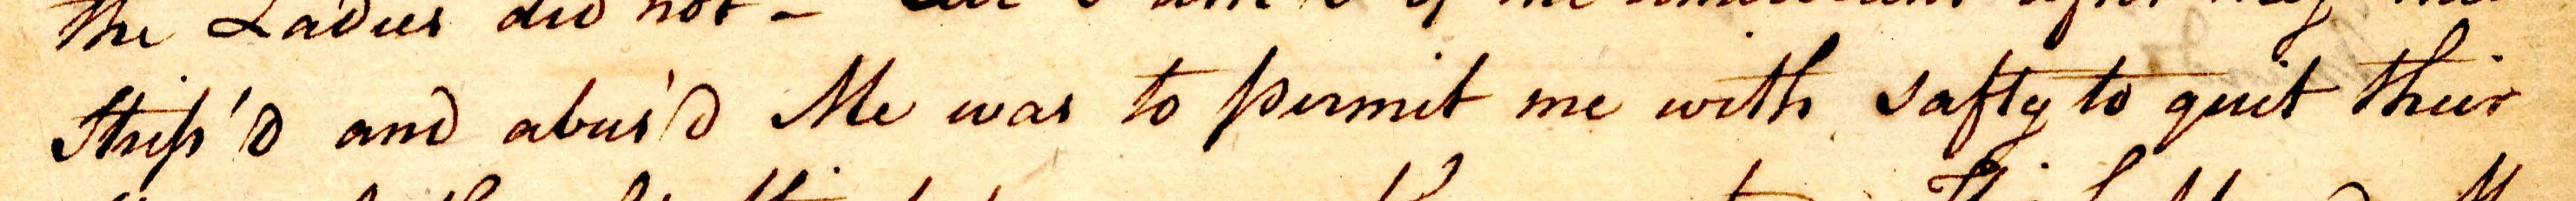Stress'd and abus'd Me was to permit me with safty to quit their
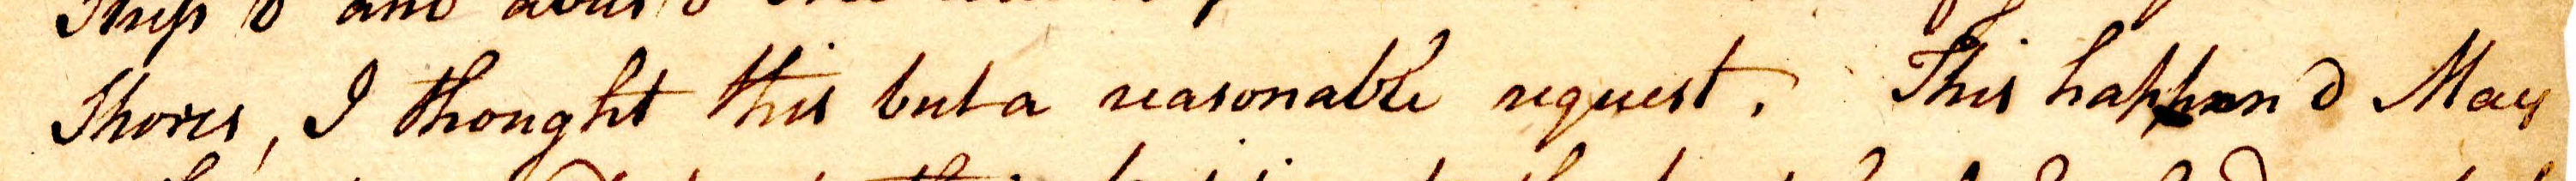Shores, I thought this but a reasonable request. This happend May
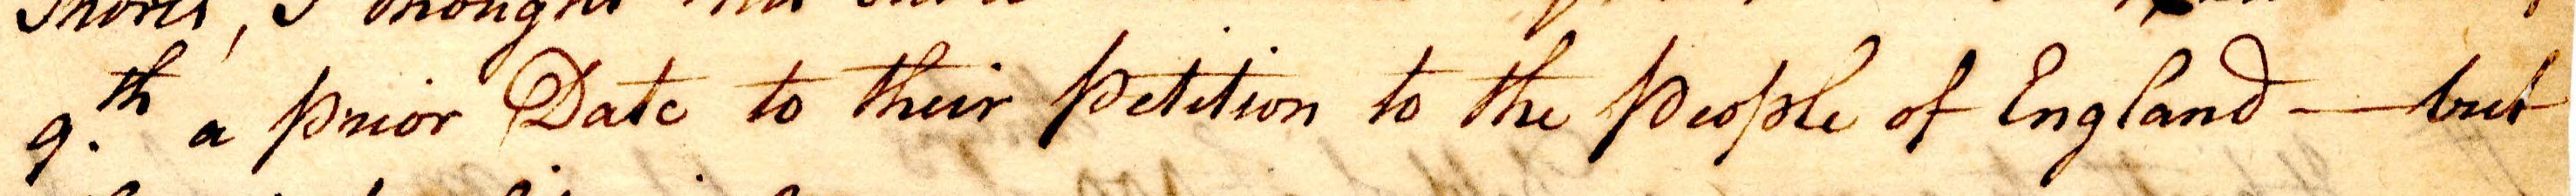9^th. a prior Date to their petition to the people of England, but
